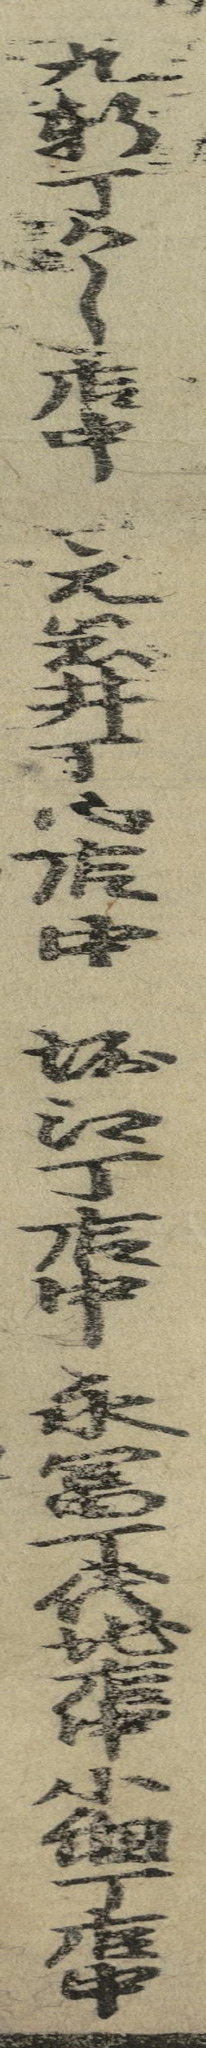九軒丁かし店中元岩井丁同店中堀江丁店中永冨丁代地店中小網丁店中
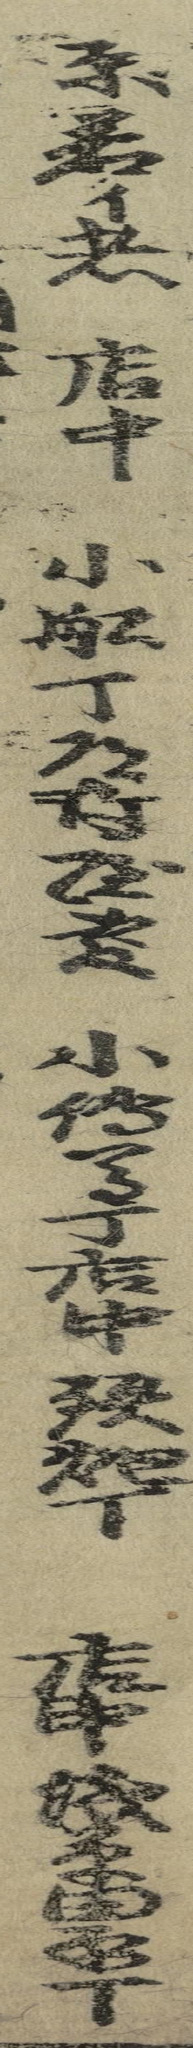京若イ者店中小船町道有屋敷小伝馬丁店中鉄炮丁店中浅草田原丁
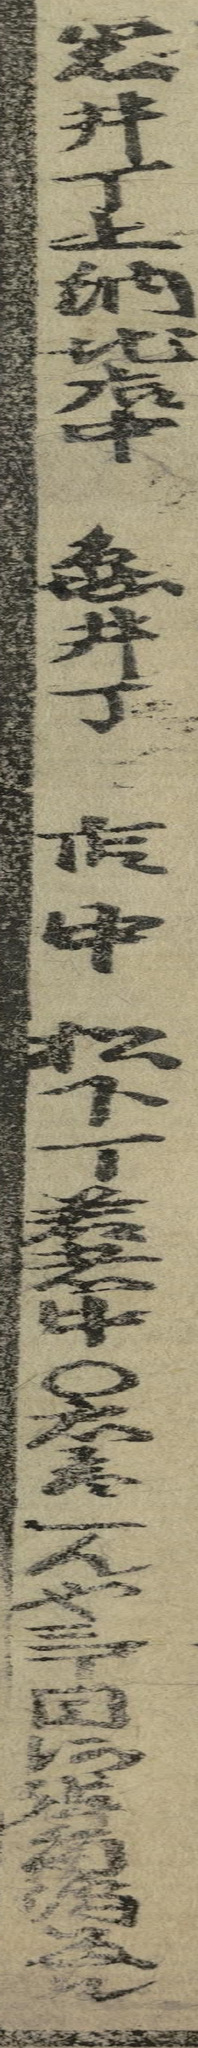岩井丁上納地店中亀井丁店中松下丁若者中◯右嶋こんや三丁目川岸角消留ㇽ
